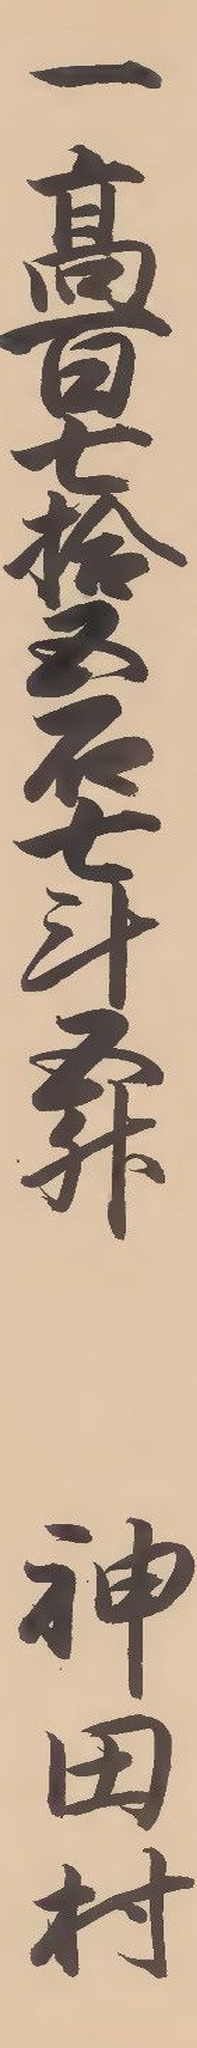一高百七拾五石七斗五升神田村
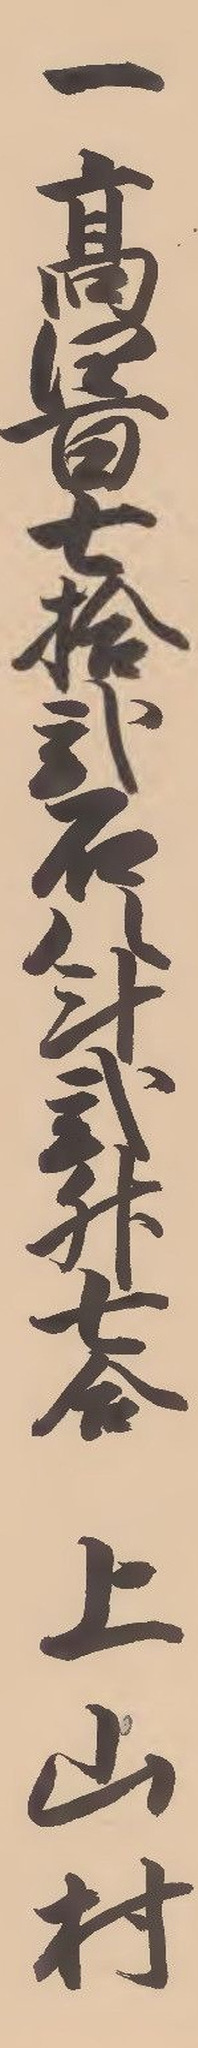一高四百七拾弐石八斗弐升七合上山村
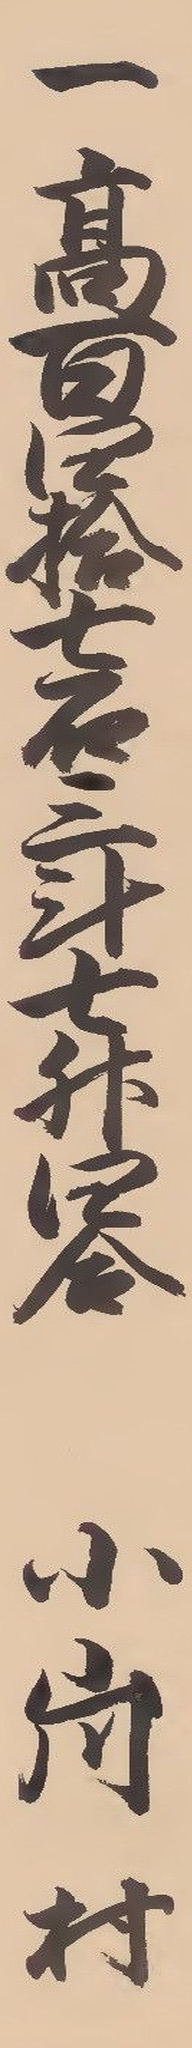一高百四拾七石三斗七升四合小村
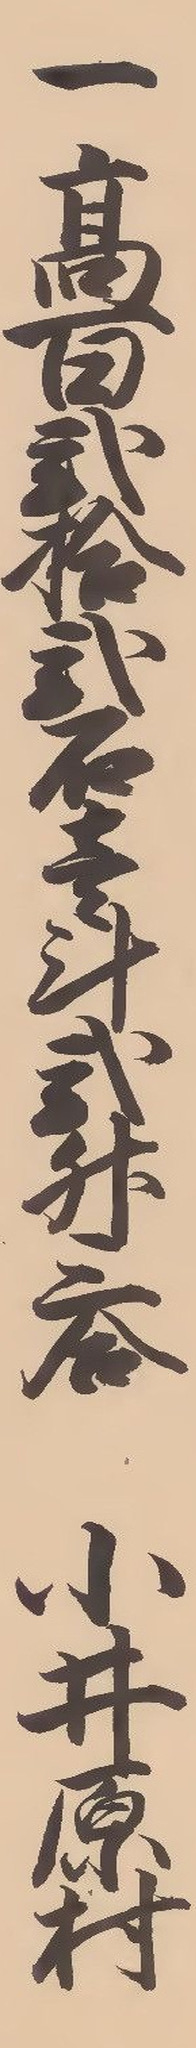一高百弐拾弐石壱斗弐升三合小井原村
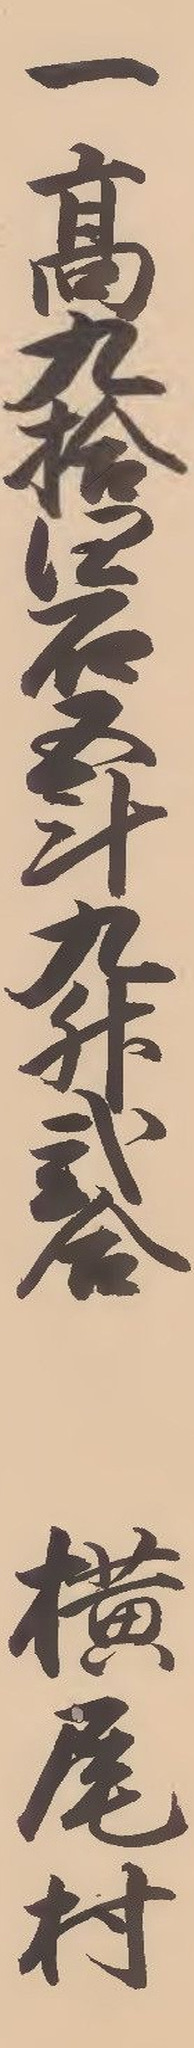一高九拾四石五斗九升弐合横尾村
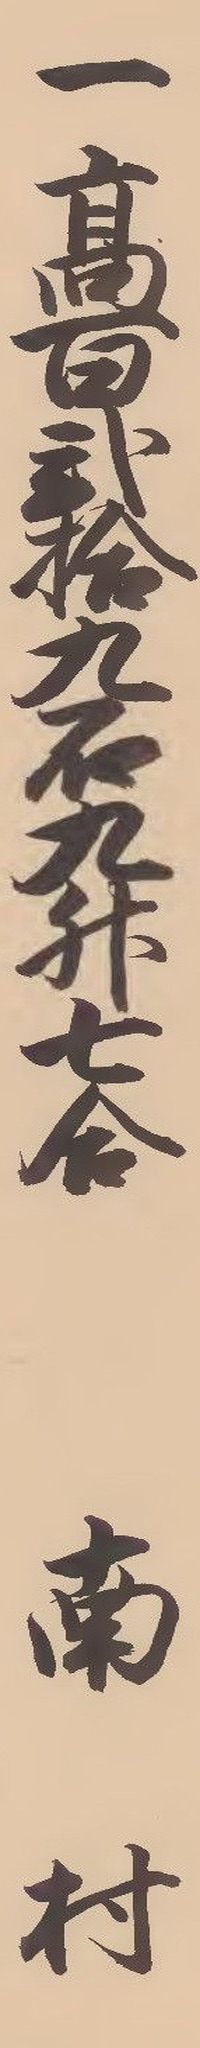一高百弐拾九石九升七合南村
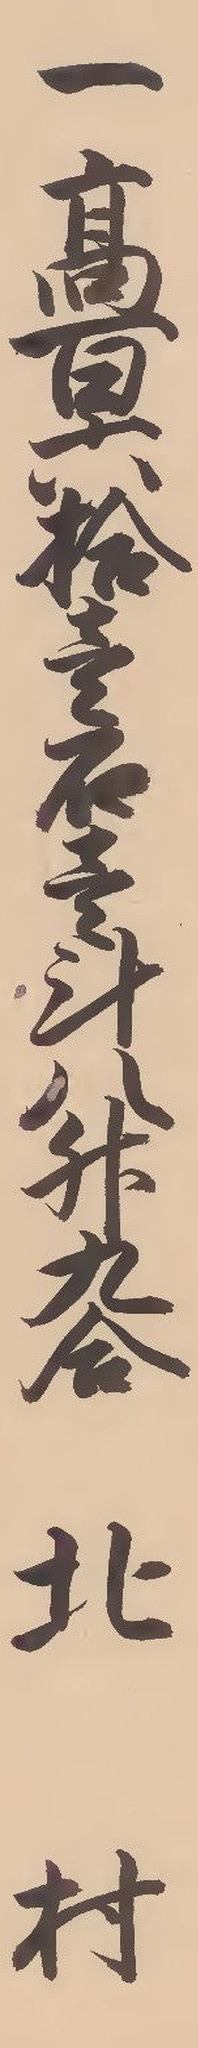一高百六拾壱石壱斗八升九合北村

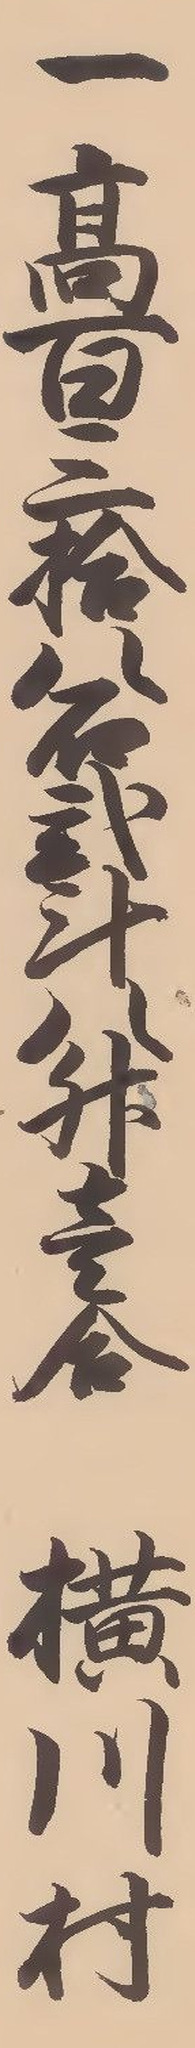一高百三拾八石弐斗八升壱合横川村
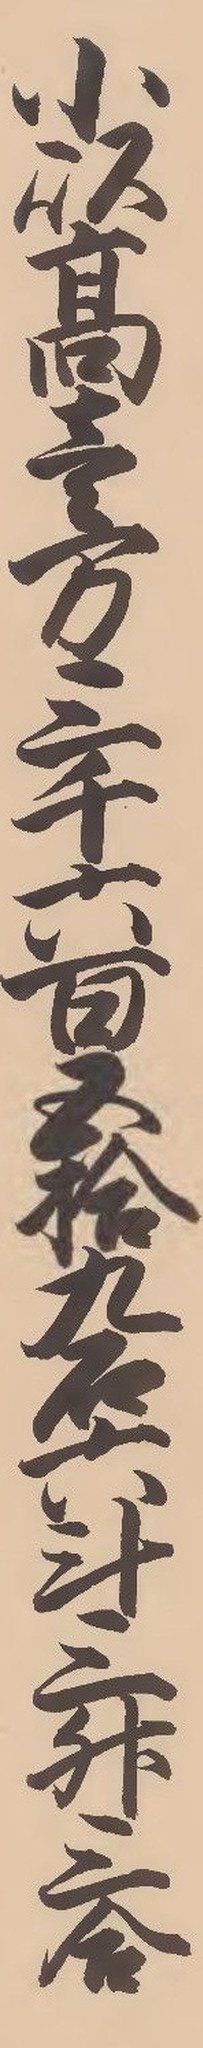小以高壱万三千六百五拾九石六斗三升三合
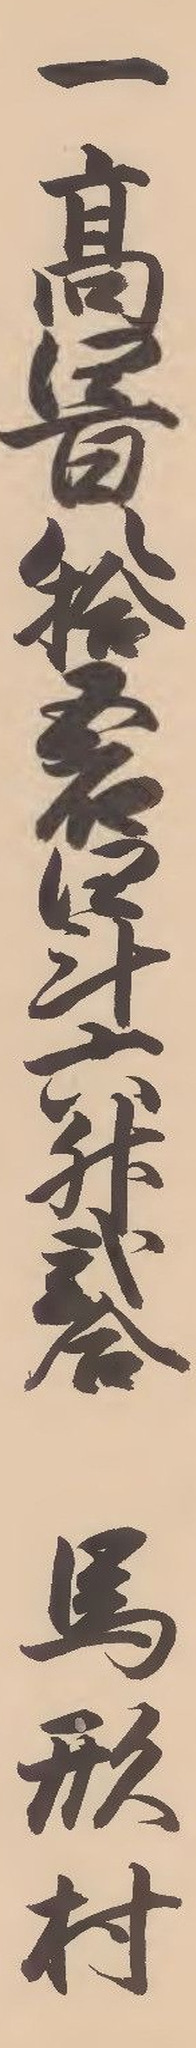一高四百八拾五石四斗六升弐合馬形村
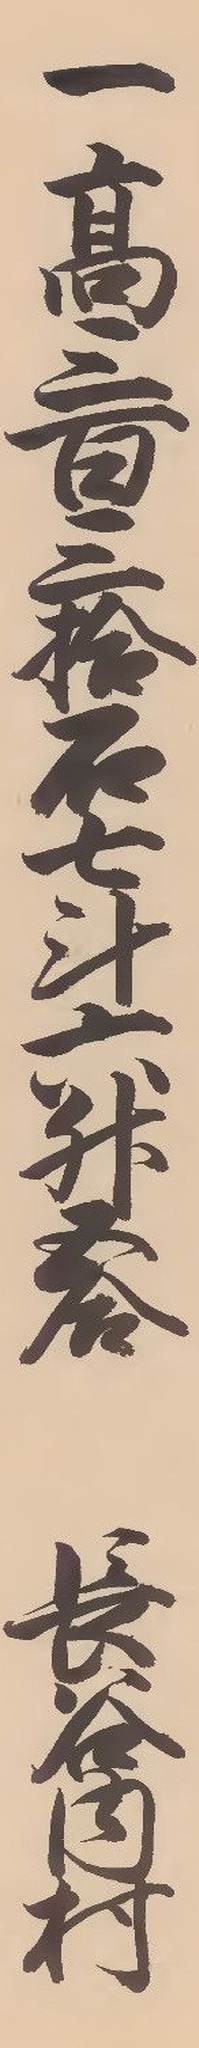一高三百三拾石七斗六升五合長谷内村
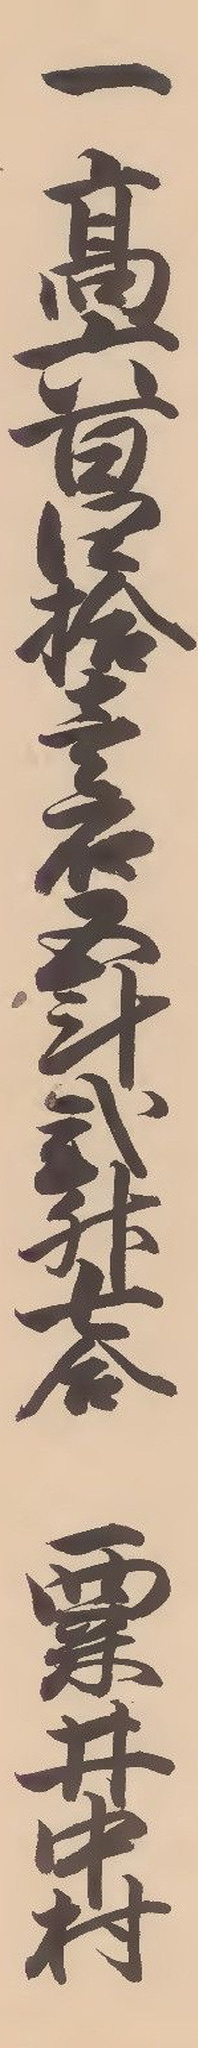一高六百四拾壱石五斗弐升七合粟井中村

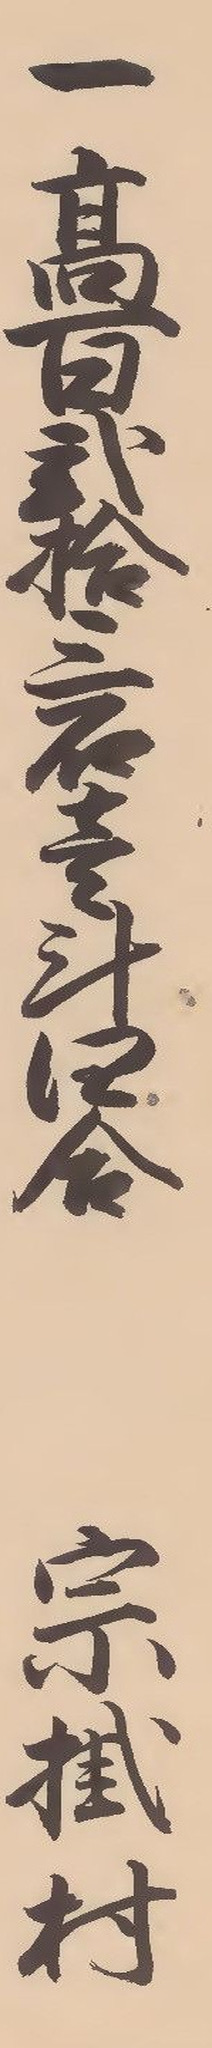一高百弐拾三石壱斗四合宗掛村
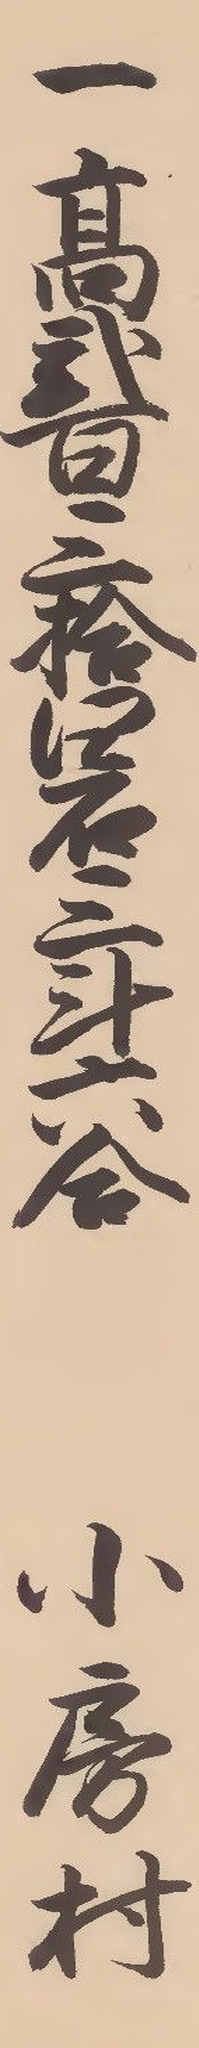一高弐百三拾四石三斗六合小房村
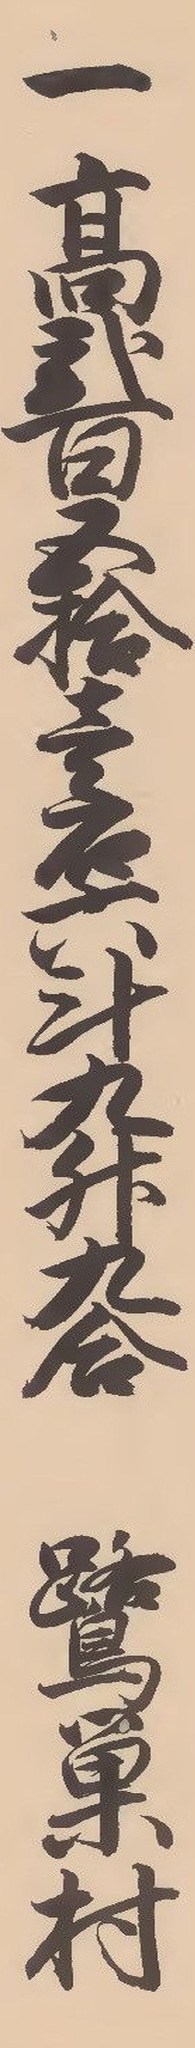一高弐百五拾壱石六斗九升九合鷺巣村
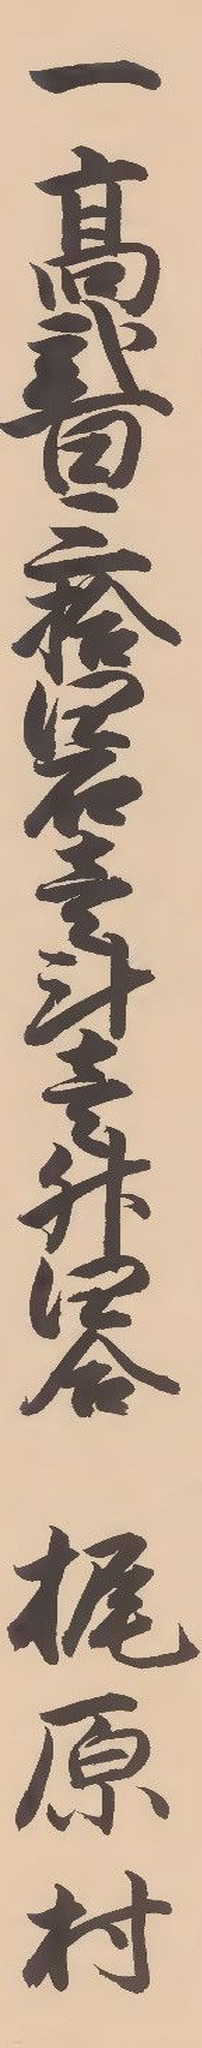一高弐百三拾四石壱斗壱升四合梶原村
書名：美作国郷帳
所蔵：国立公文書館 National Archives of Japan
